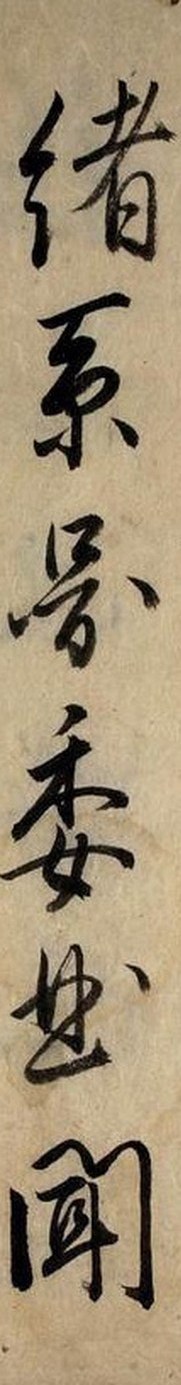緒系図委曲聞
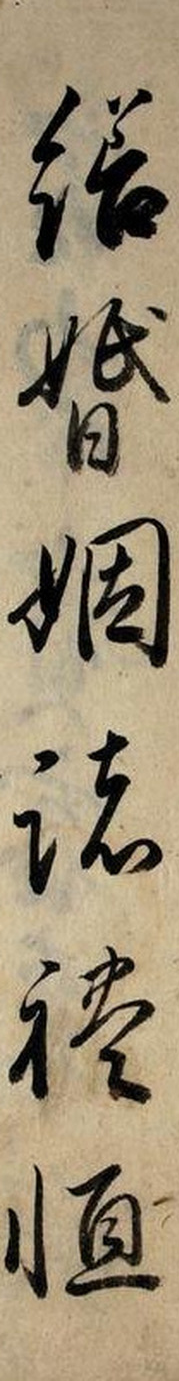繕婚姻諸礼恒
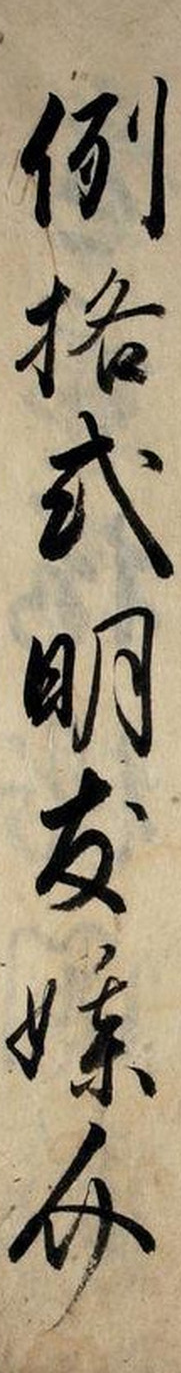例格式朋友媒介
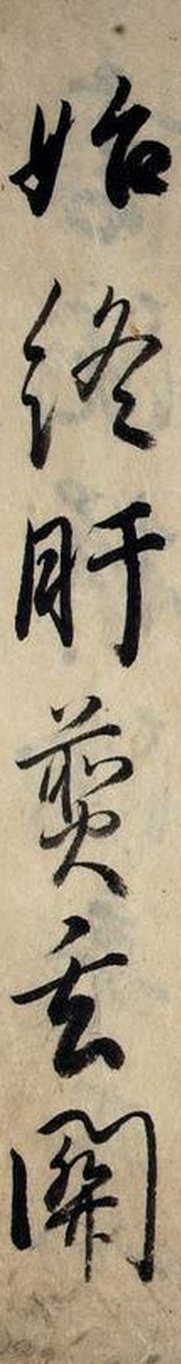始終肝煎玄関

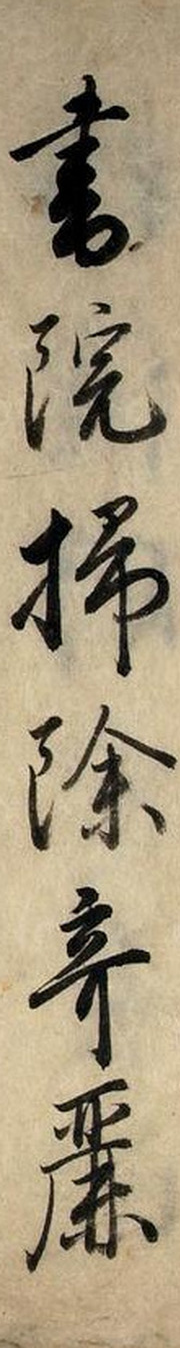書院掃除奇麗
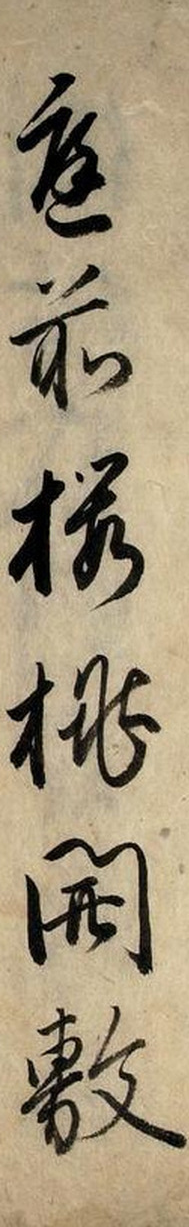庭前桜桃開敷
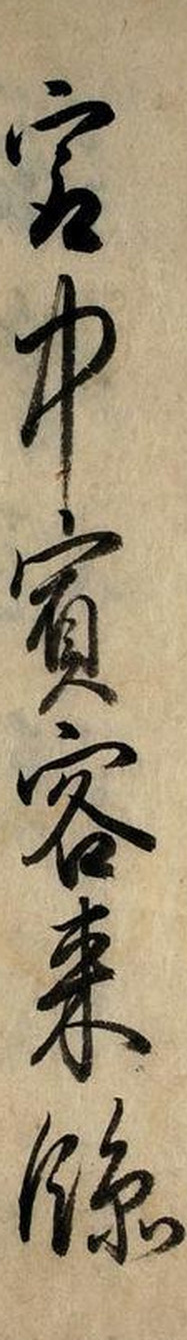最中賓客来臨
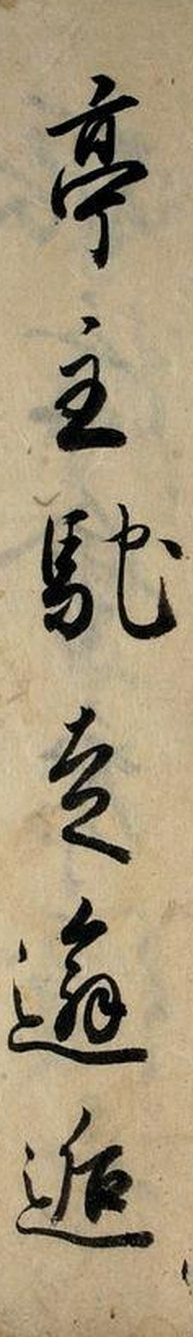亭主馳走邂逅
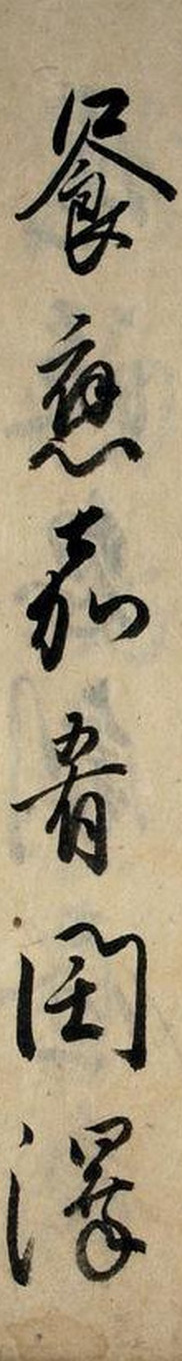饗応嘉肴閏沢
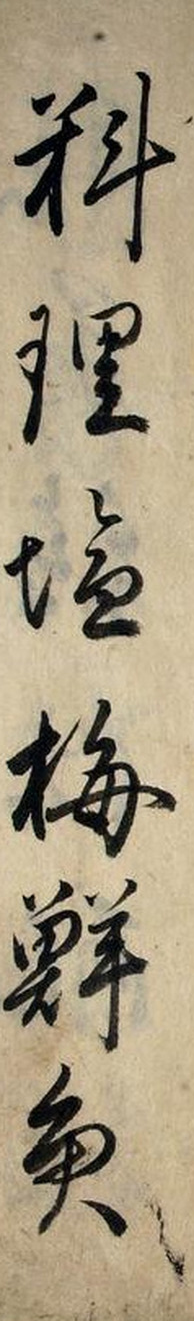料理塩梅鮮魚

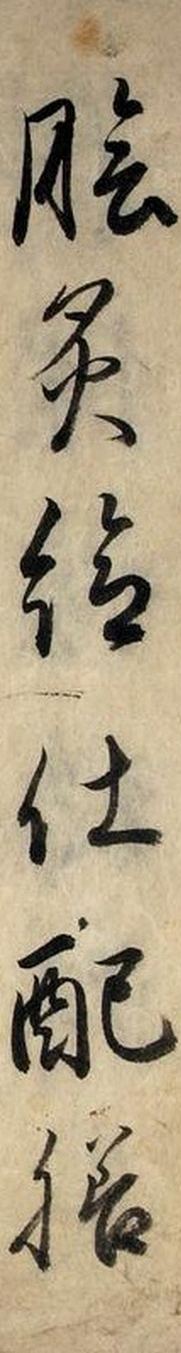膾炙給仕配膳
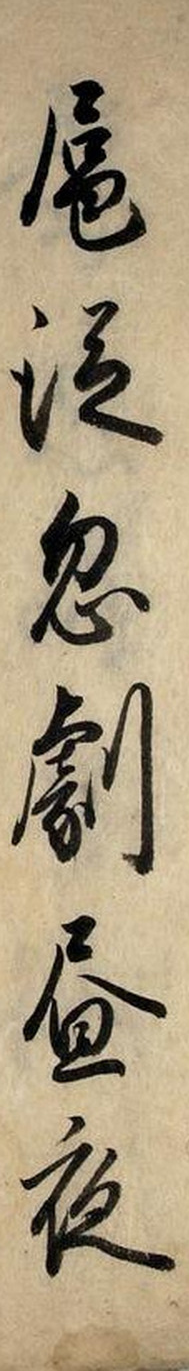扈従忽劇昼夜
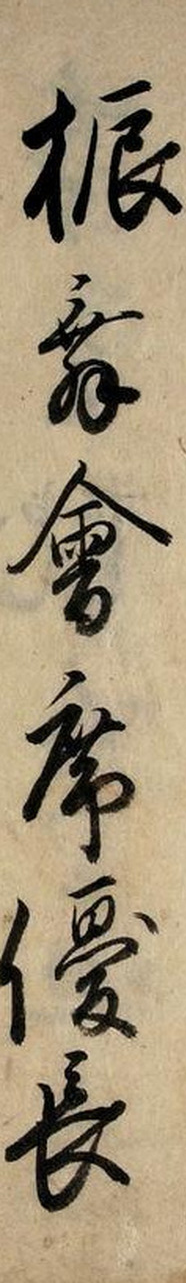振舞会席優長
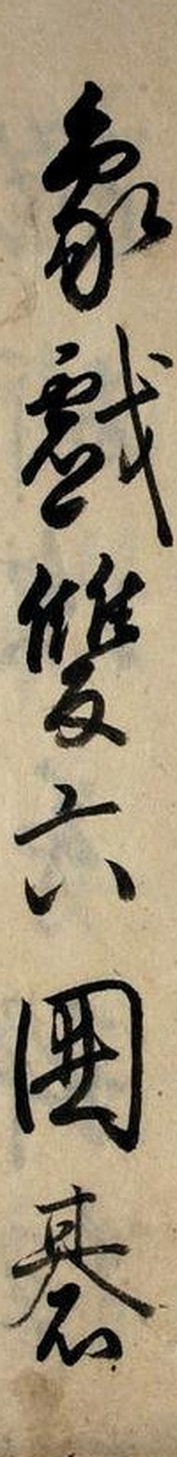象戯双六囲碁
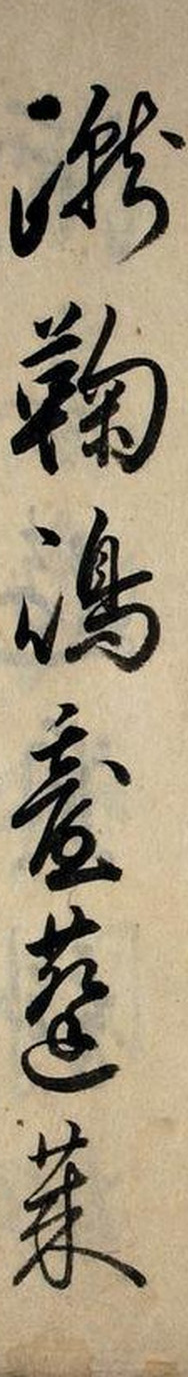蹴鞠島台蓬莱
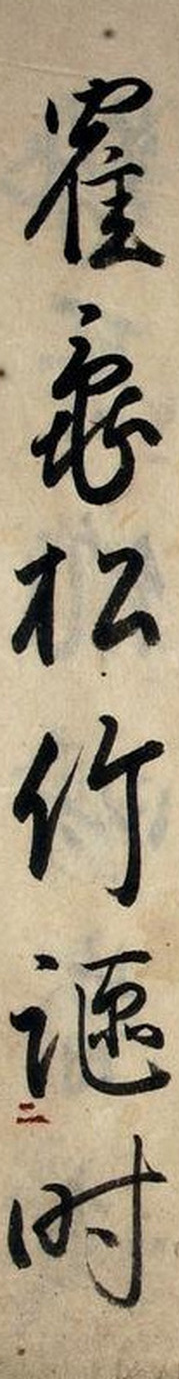鶴亀松竹謡時
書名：世話千字文（手習手本）
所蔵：福井県文書館 Fukui Prefectural Archives
